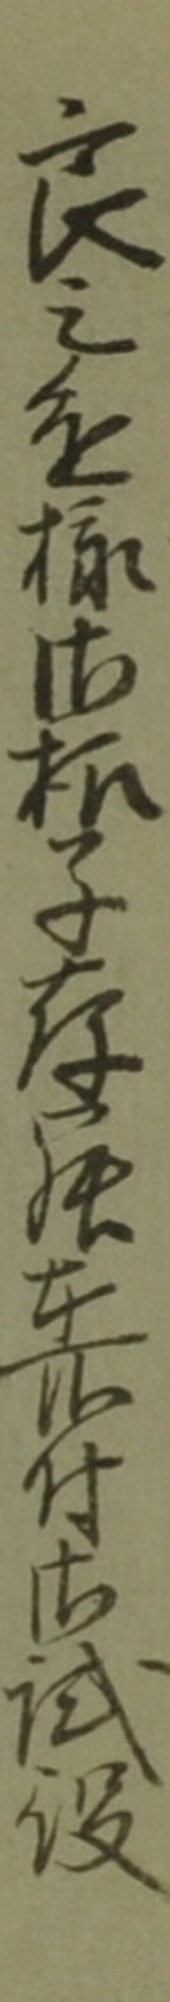良之進様御様子存罷在付御試役
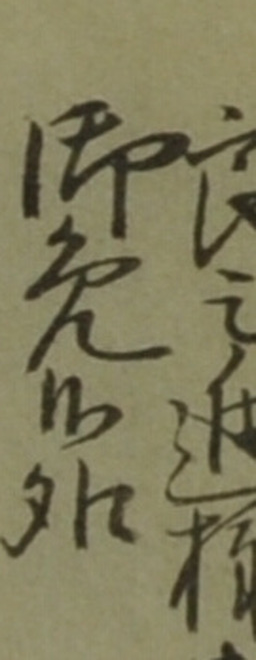御免候処
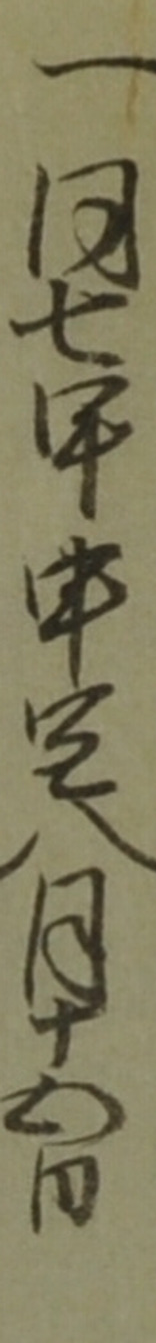一同七甲申閏八十五日
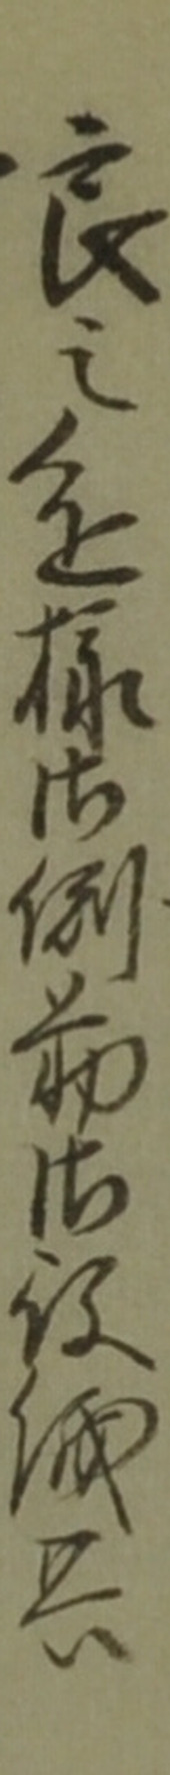良之進様御側勤役儀共
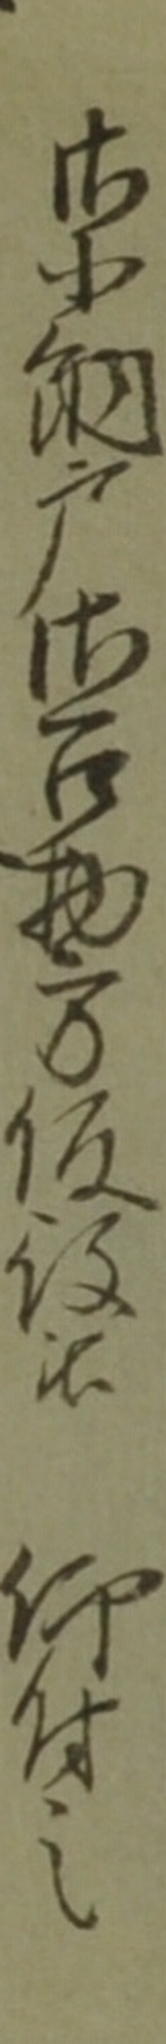御小納戸御召物方仮役被仰付之
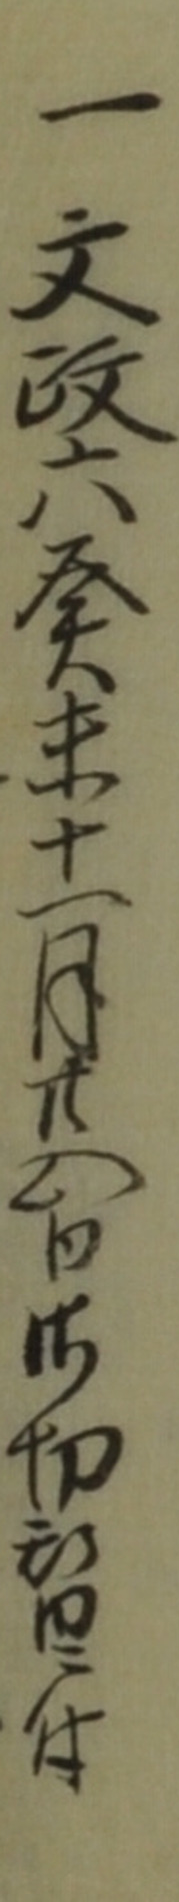一文政六癸未十一月廿五日御切替ニ付
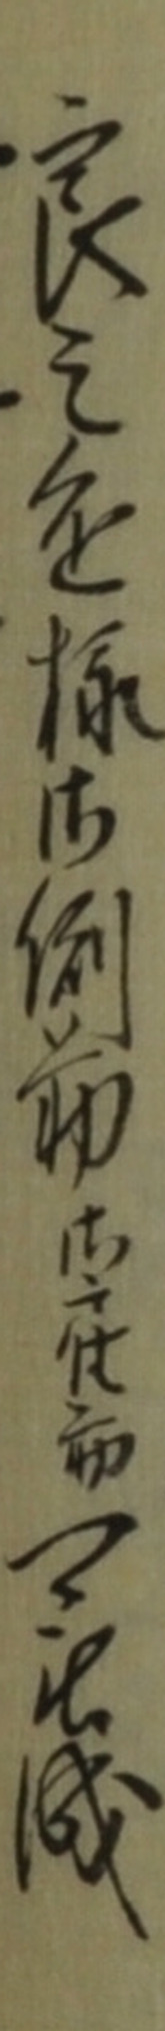良之進様御側勤御雇勤可被成
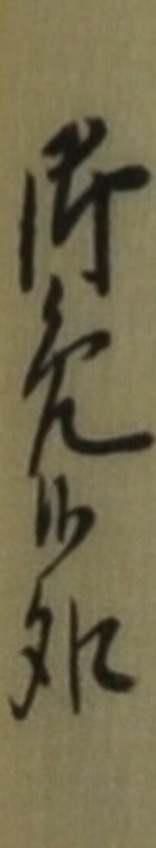御免候処
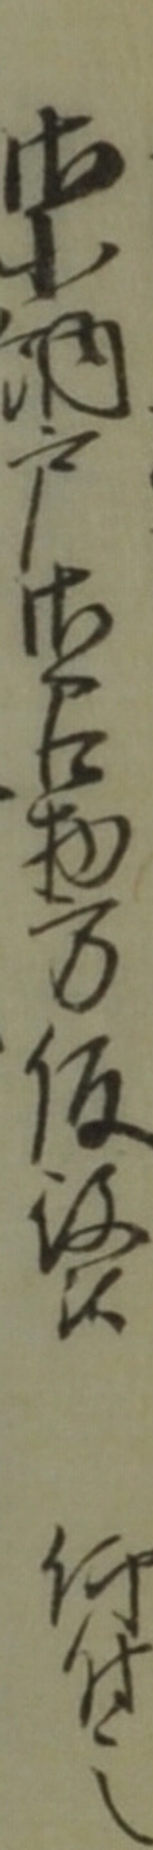御小納戸御召物方仮役被仰付之
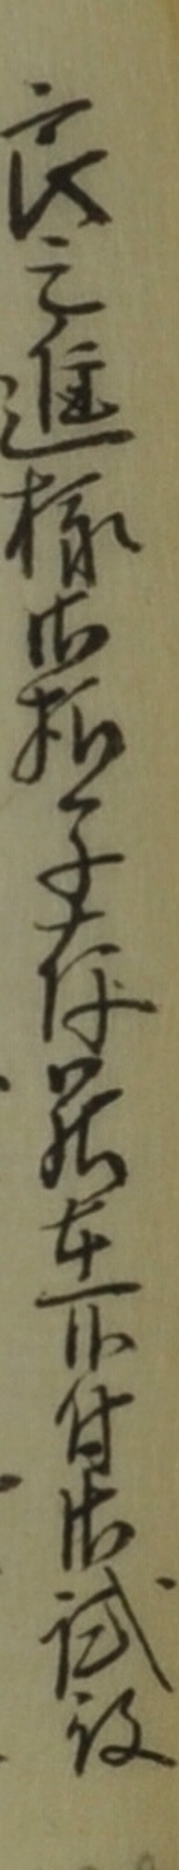良之進様御様子存罷在付御試役
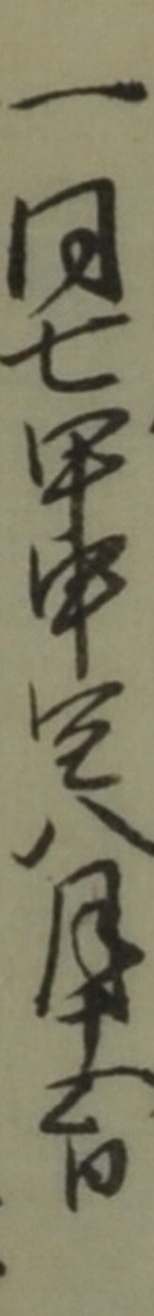一同七甲申閏八十五日
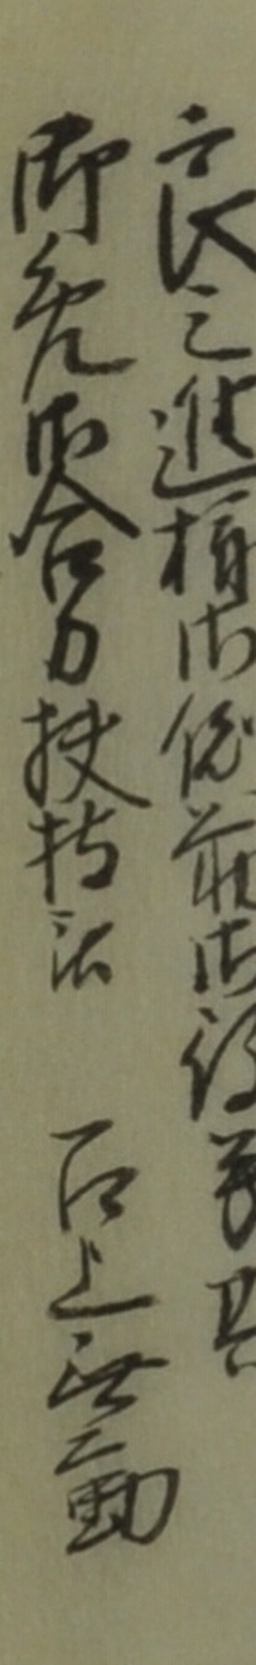御免御合力扶持被召上無勤
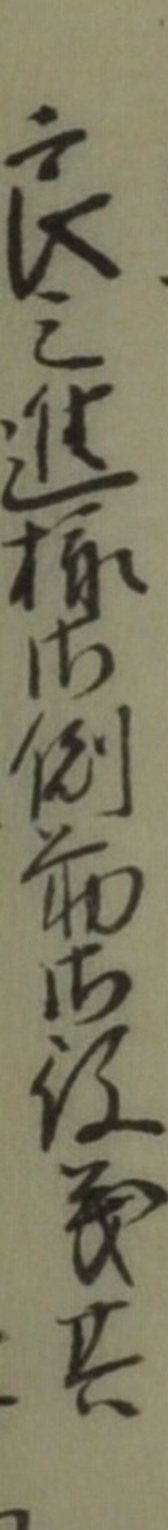良之進様御側勤役儀共
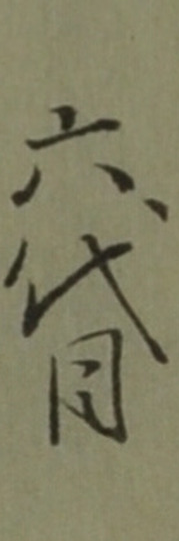六代目
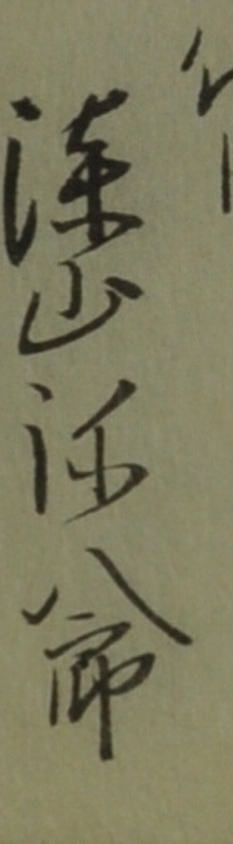漆山弥八郎
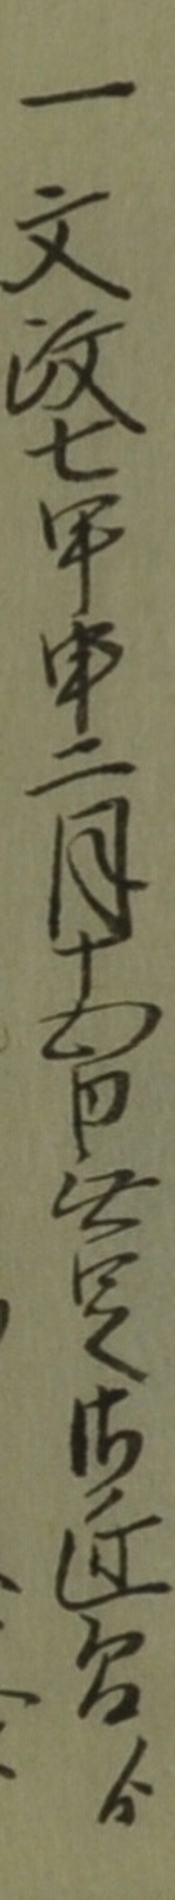一文政七甲申二月十五日無足御近習ゟ
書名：諸御役代々録（四）
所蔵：伊那市立高遠町図書館・合同会社AMANE
